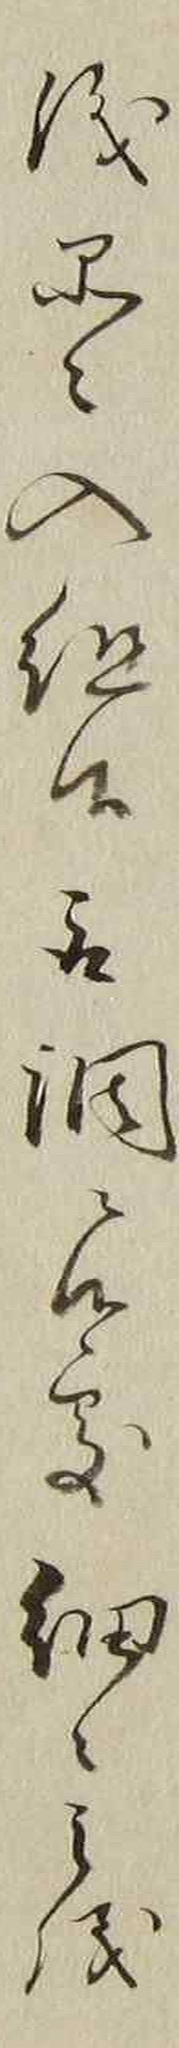儀品々入組候取調ニ候処細々之儀
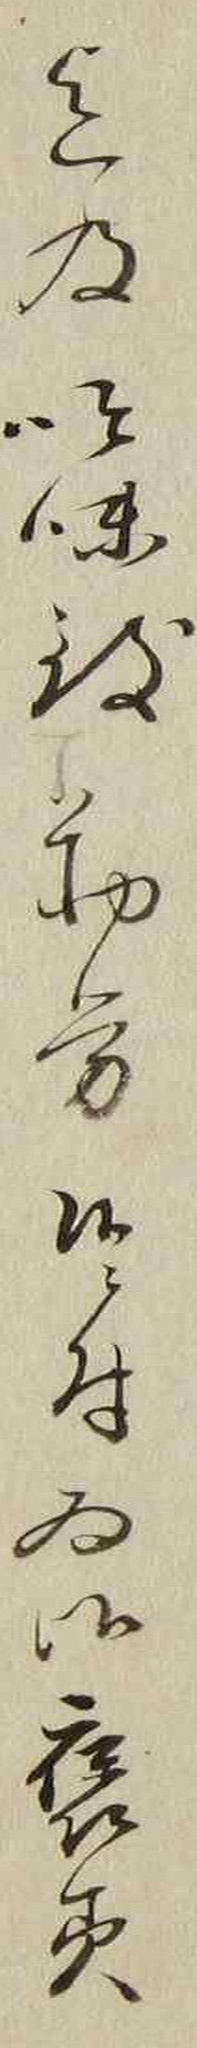迄及吟味致勤労候ニ付為御褒美
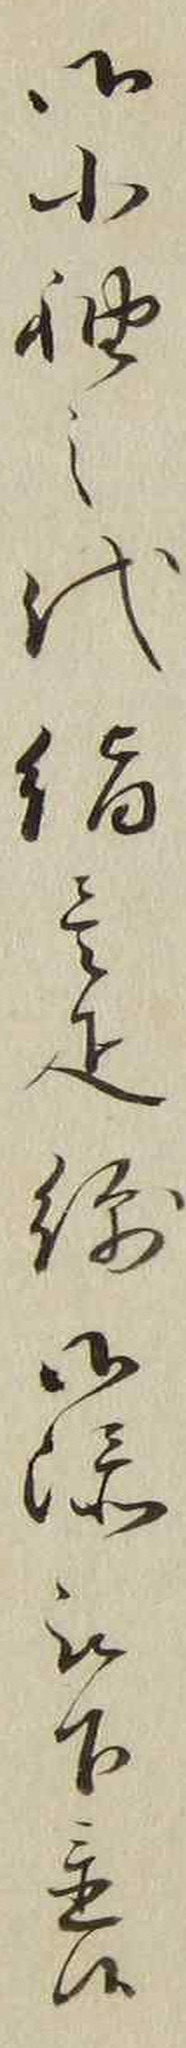御小袖之代絹壱疋綿御添被下置候

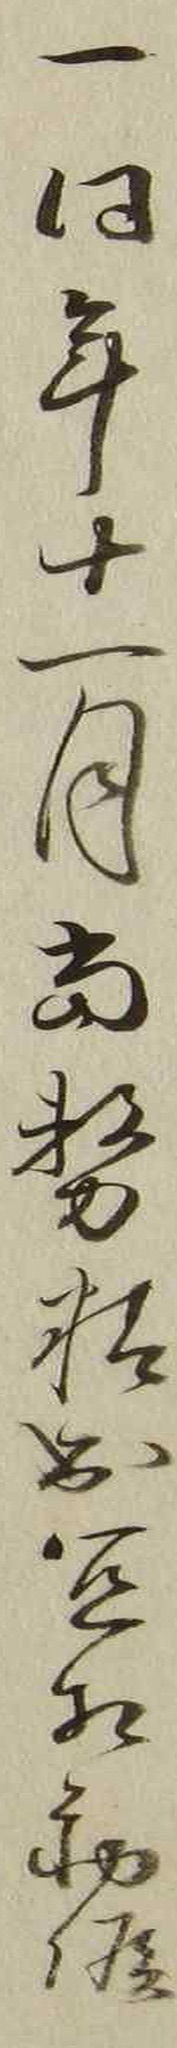一同年十一月当務精出宜相勤候
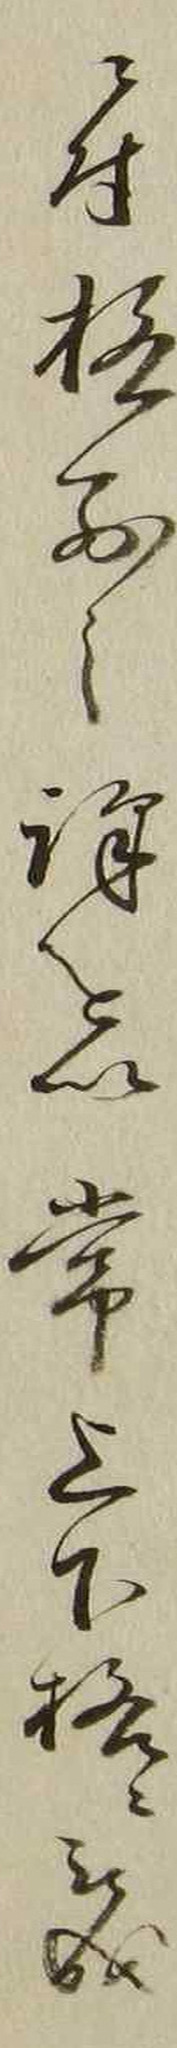ニ付格別之訳を以常上下格ニ被成
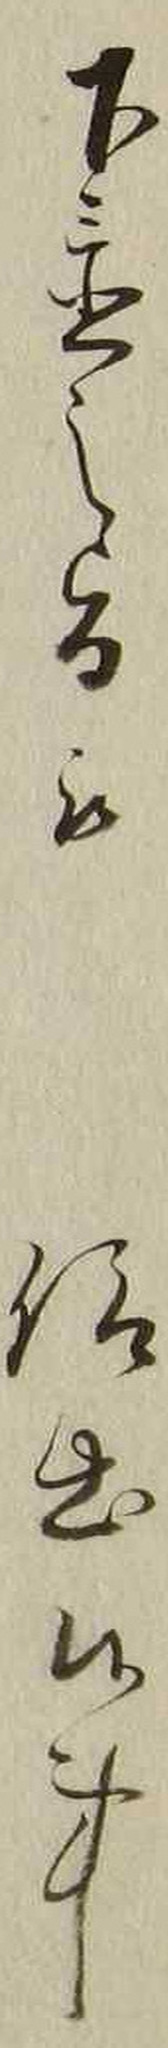下置之旨被仰出候事
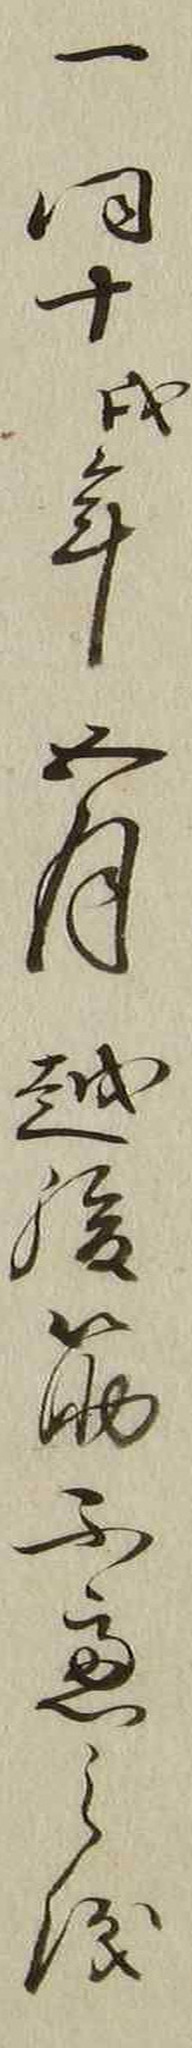一同十戌年五月越後筋不慮之儀
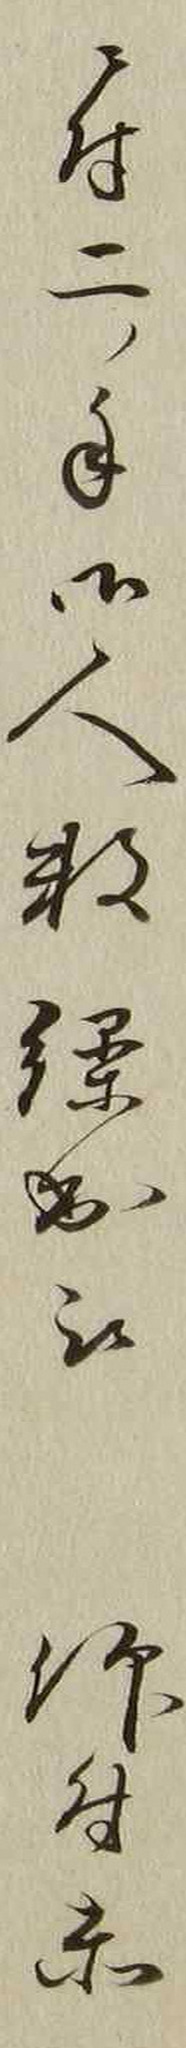ニ付二ノ手御人数繰出被仰付赤
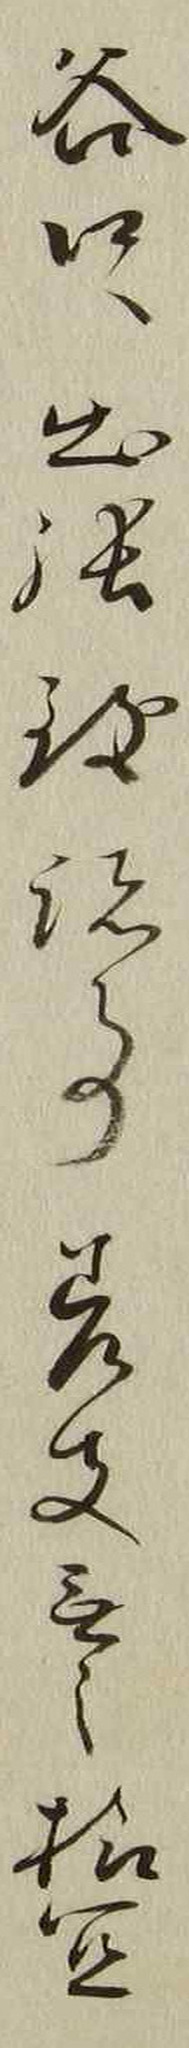谷口へ出張致諸事差支無之様宜
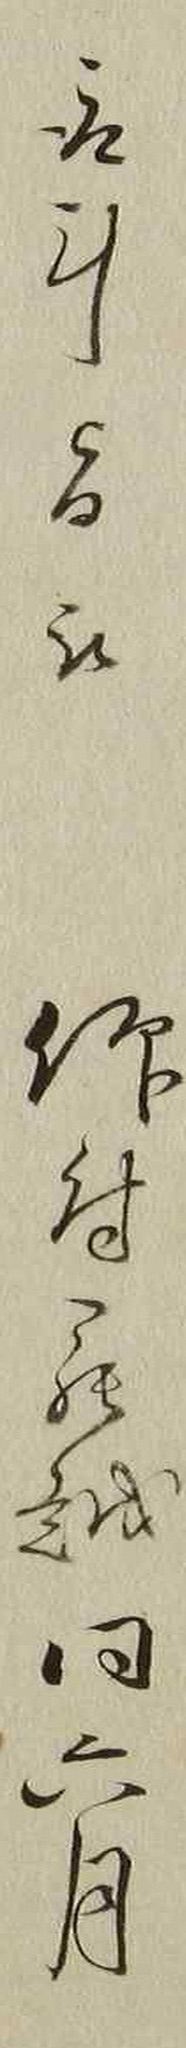取計旨被仰付罷越同六月
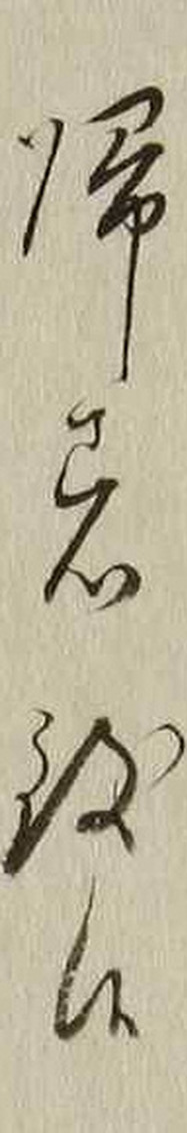帰着致候
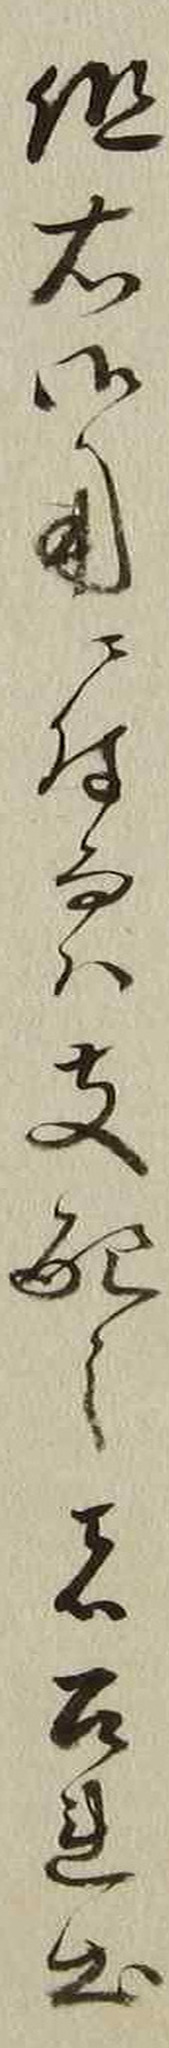但右御用ニ付而ハ支配之者召連出
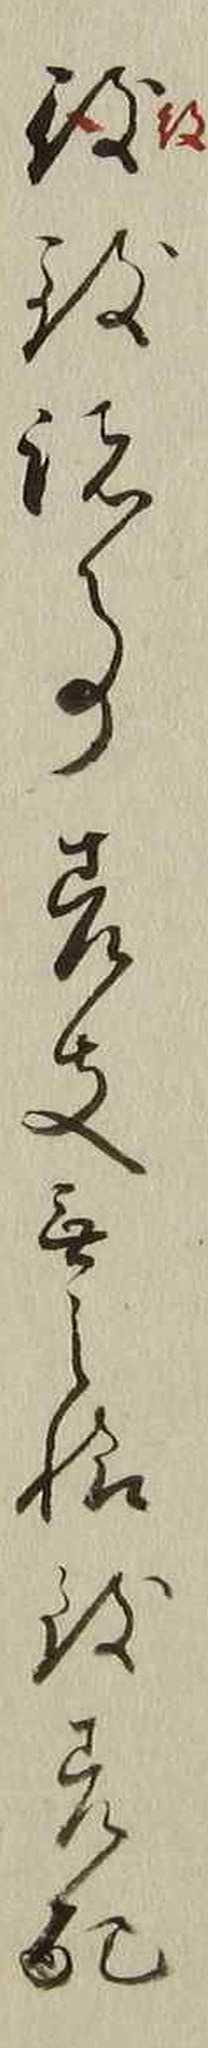役致諸事差支無之様致差配
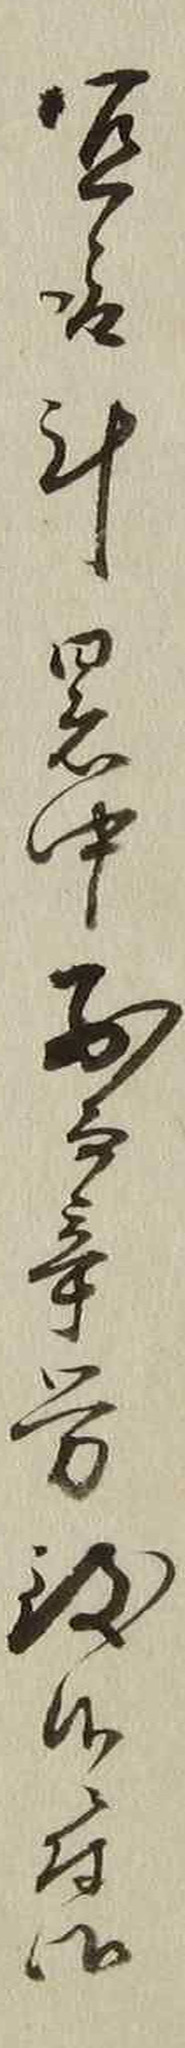宜取計暑中別而辛労致候ニ付御
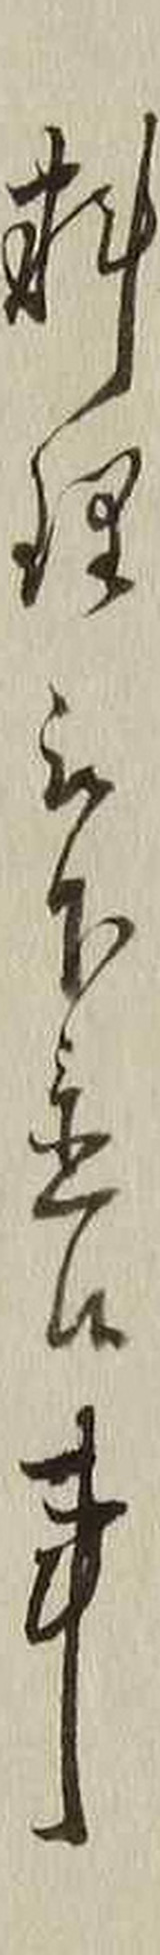料理被下置候事
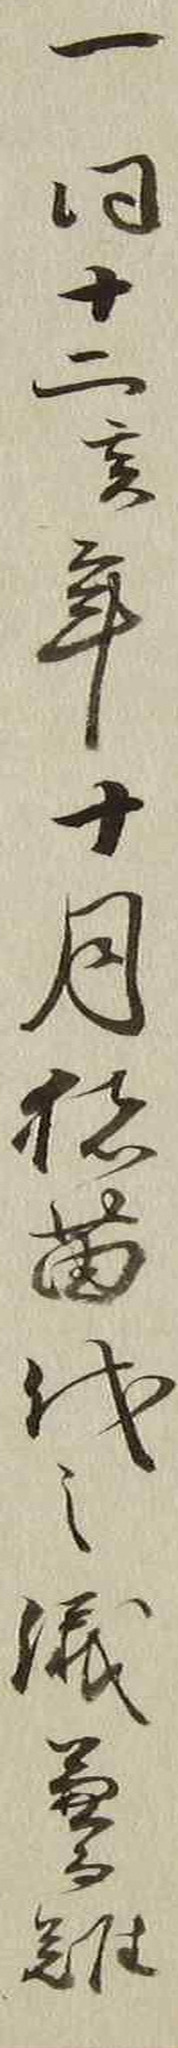一同十二亥年十月猪苗代之儀兼而難
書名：諸士系譜　巻之52　に之部3
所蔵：会津若松市立会津図書館
